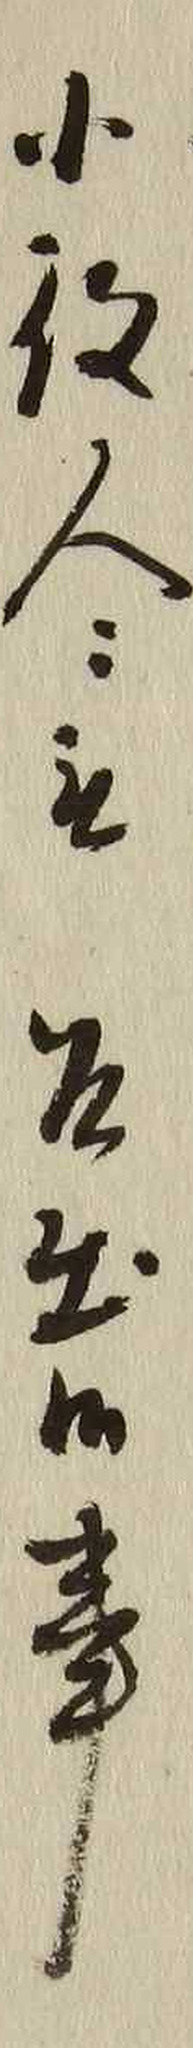小役人に被召出候事
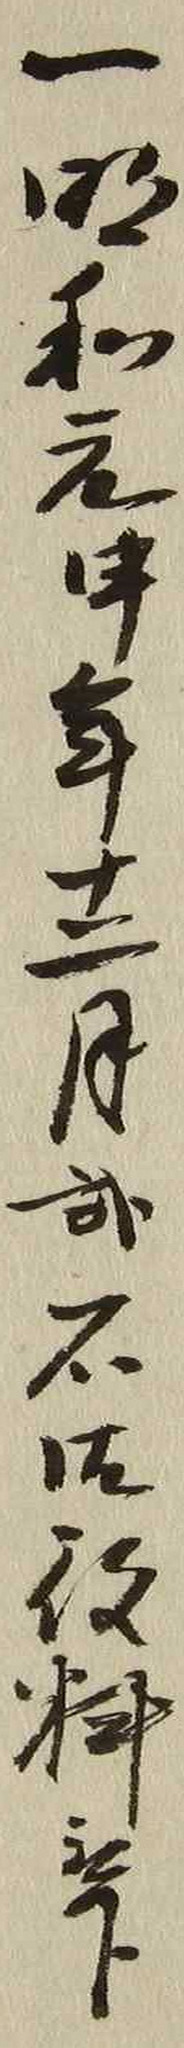一明和元申年十二月弐石御役料被下
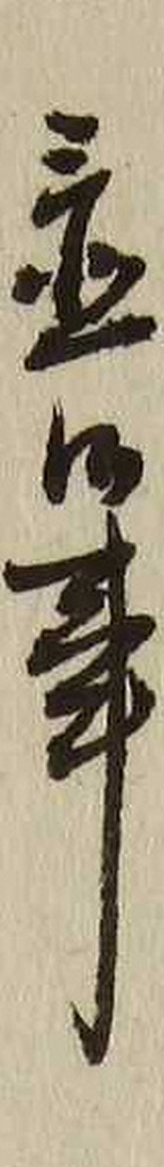置候事
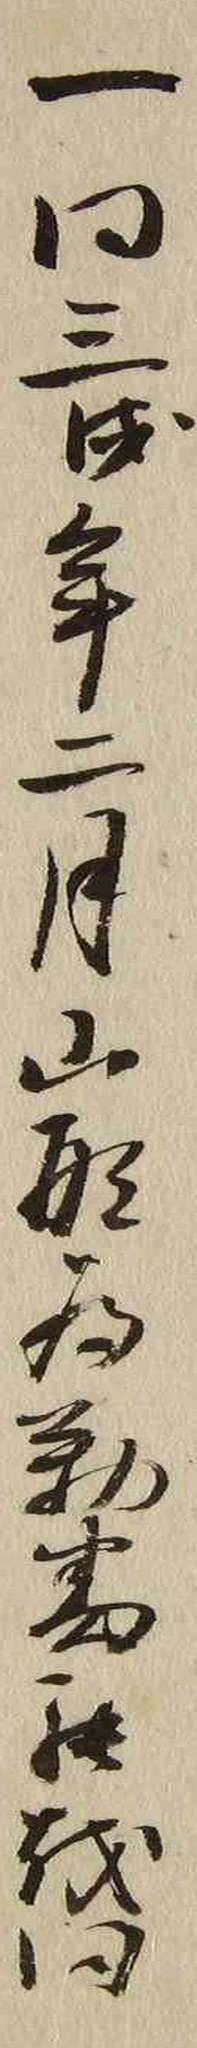一同三戌年二月山形為勤番罷越同
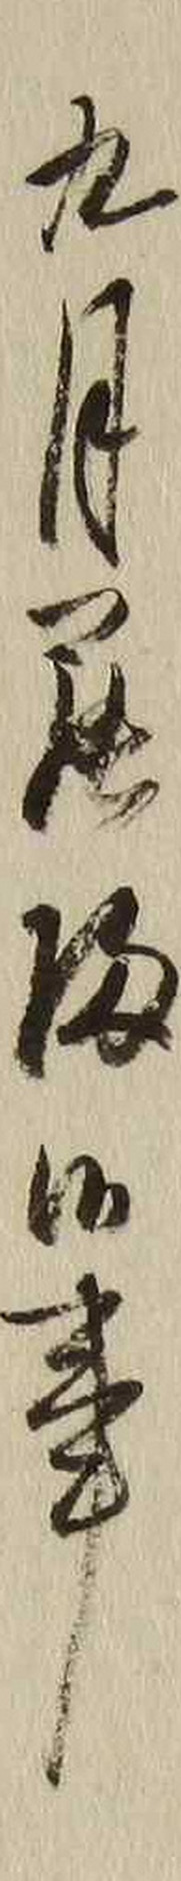九月罷帰候事
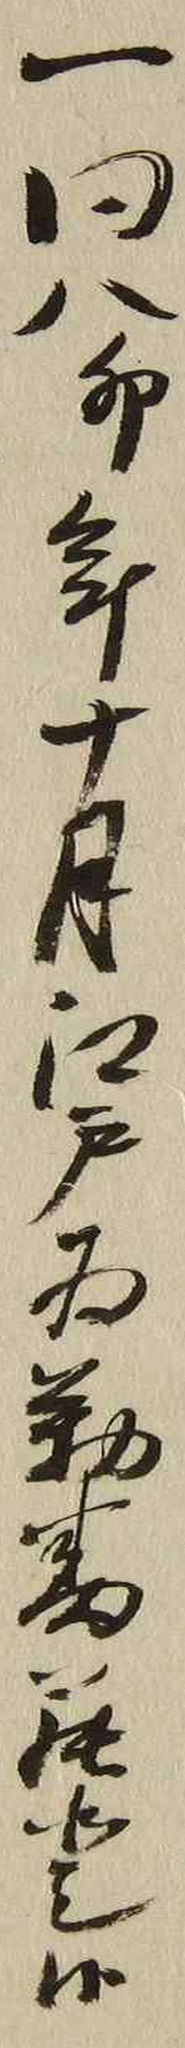一同八卯年十月江戸為勤番罷登候
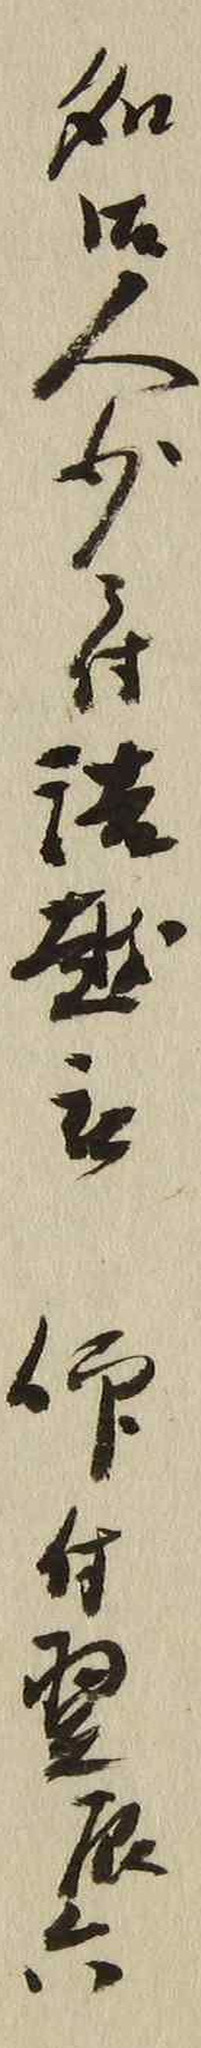処御人少に付詰越被仰付翌辰六
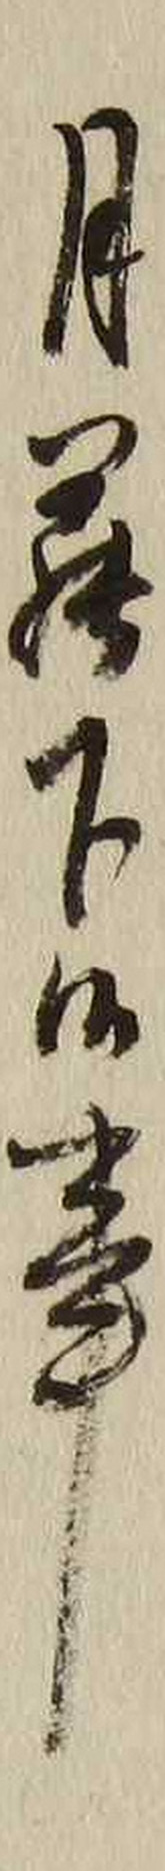月罷下候事
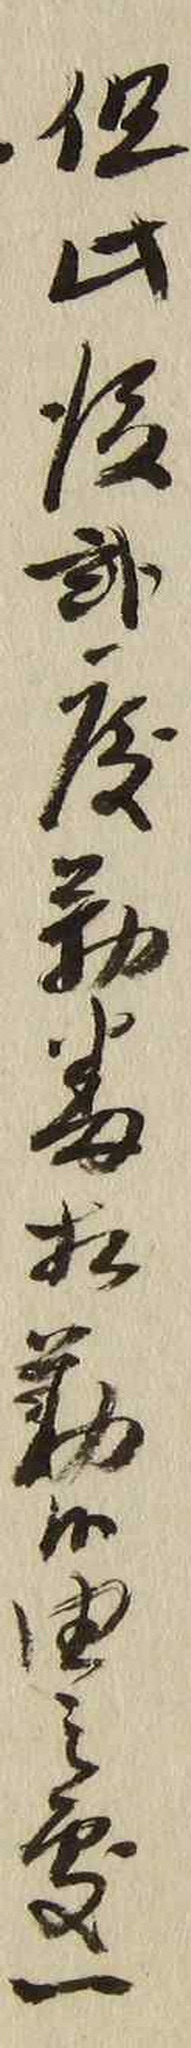但此後弐度勤番相勤候由之処一
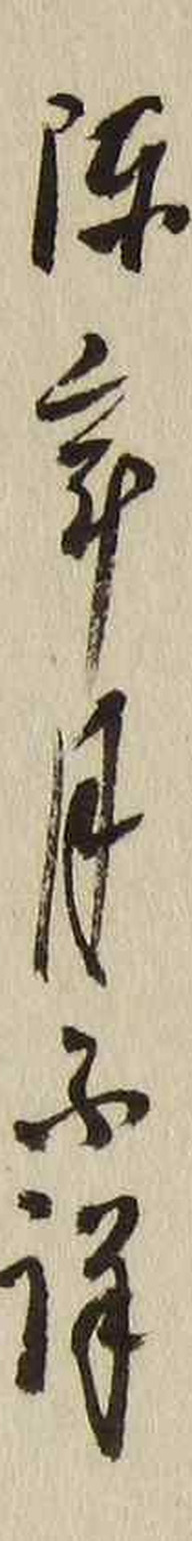陣年月不詳
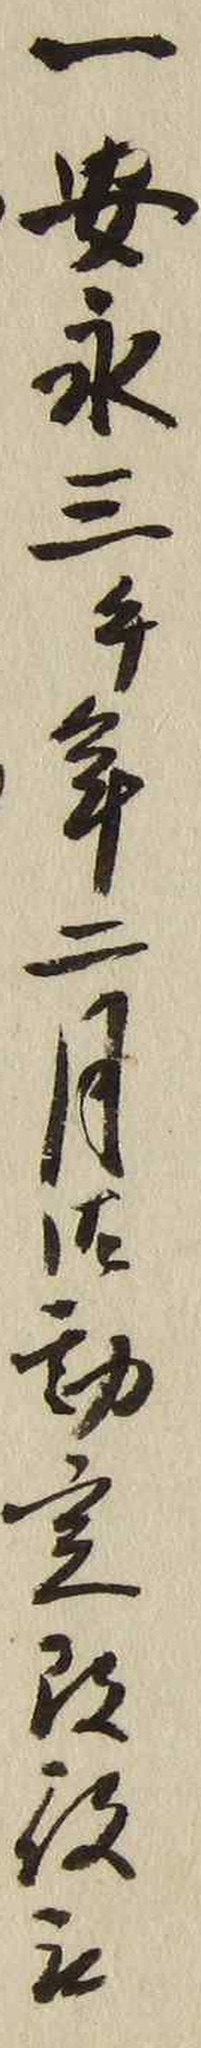一安永三午年二月御勘定改役被
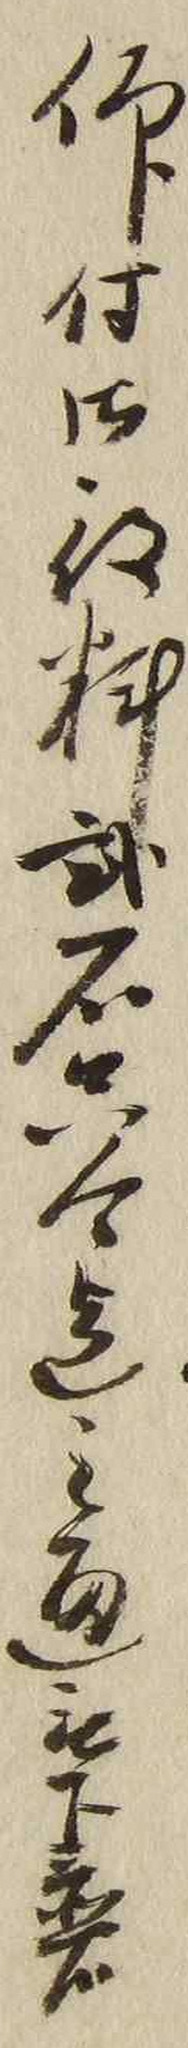仰付御役料弐石只今迄之通被下置候

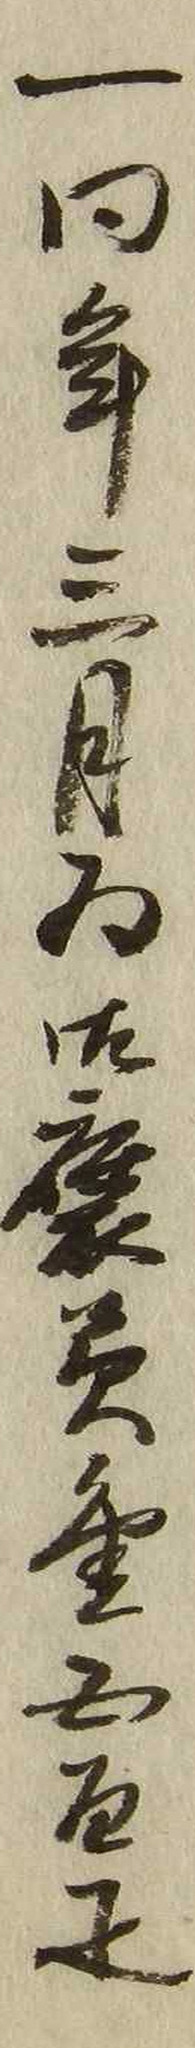一同年三月為御褒美金五百疋
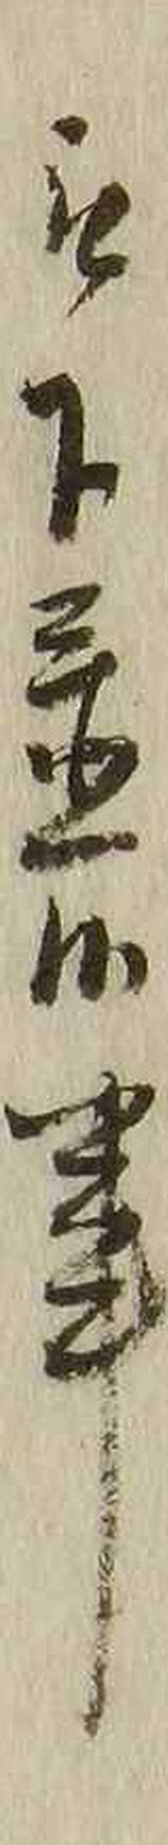被下置候事
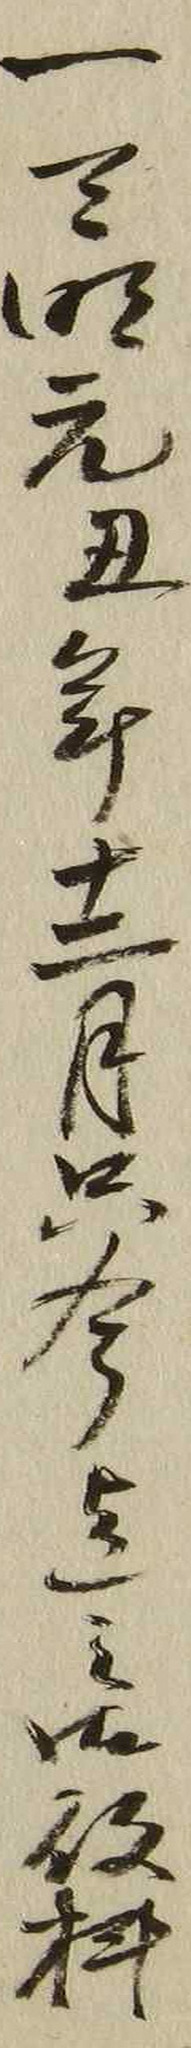一天明元丑年十二月只今迄之御役料
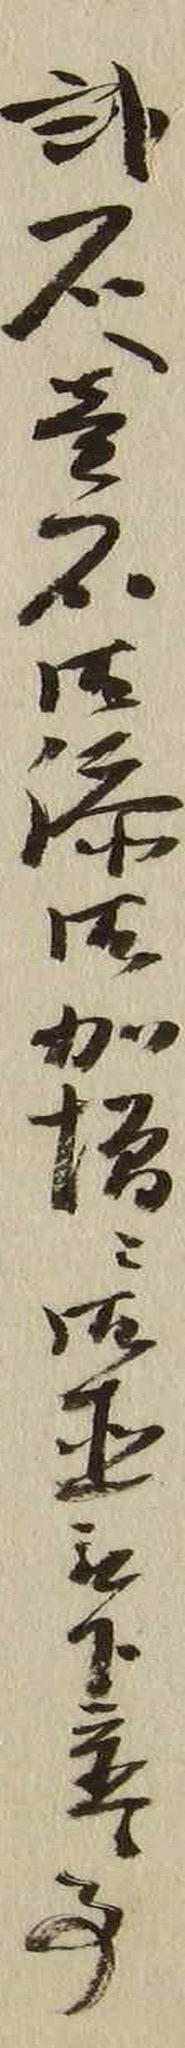弐石へ壱石御添御加増に御直被下置候事
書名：諸士系譜　巻之360　す之部10
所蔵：会津若松市立会津図書館
